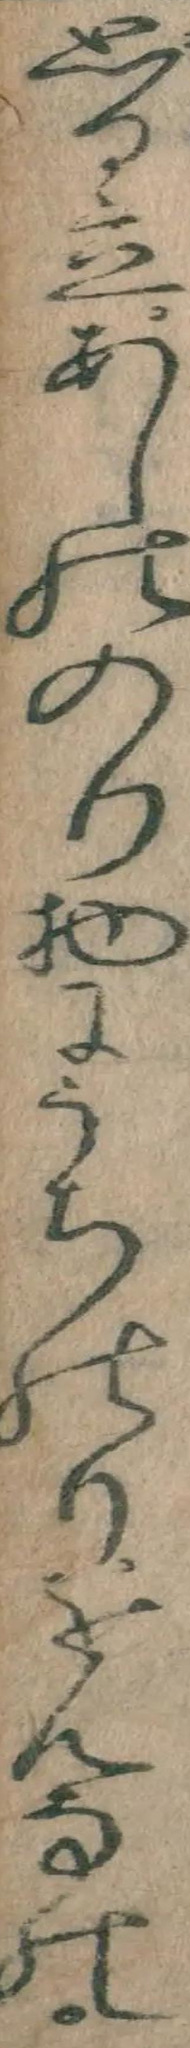思ひ立。あしののり物にうちのり。をんなの。

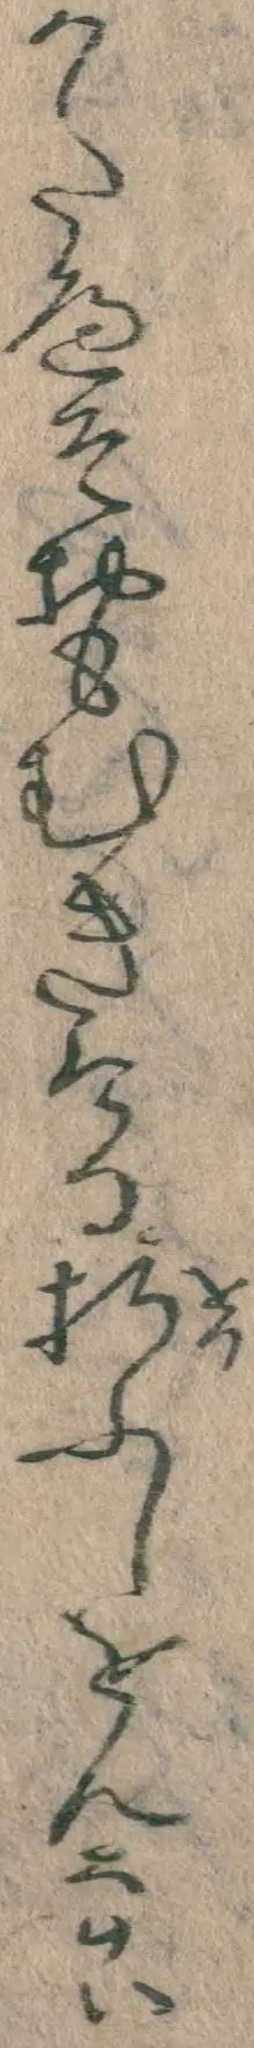かたへそおもむきける。折ふしをんなは
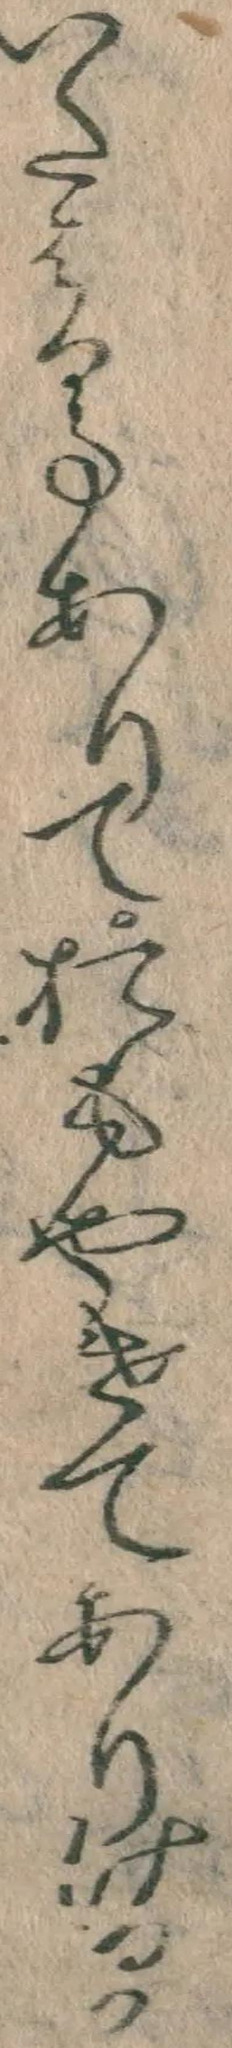いたはる事ありて。おもやせてありけるか
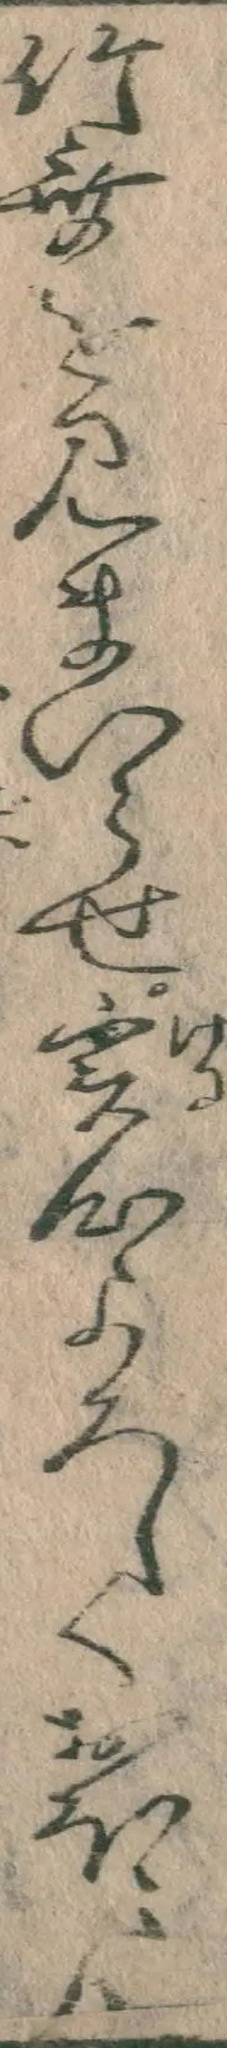竹斎を見まいらせ。実心よろしくおほえん
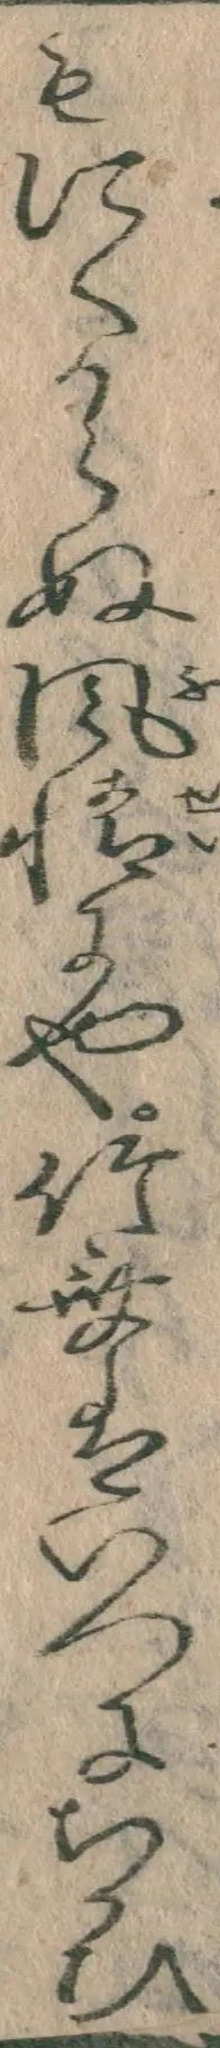もにくからぬ風情にや。竹斎はいつにちかひ
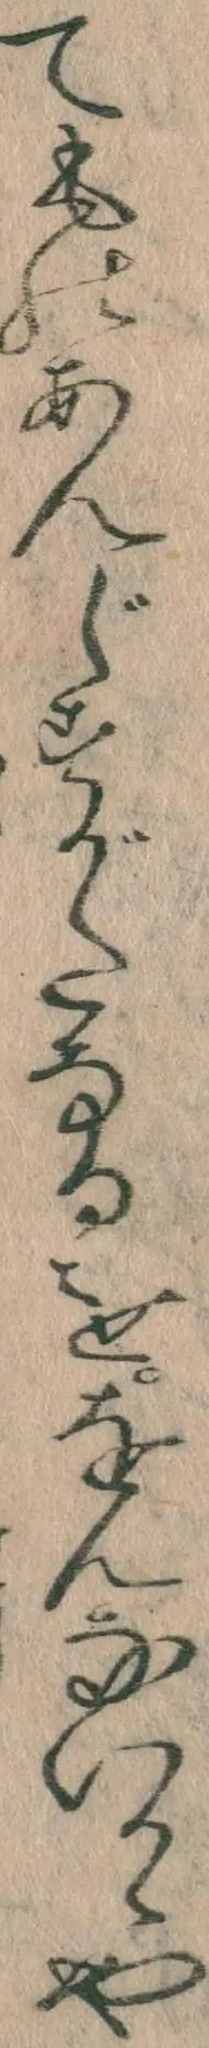てものあんじすがたなるを。をんないかゝや
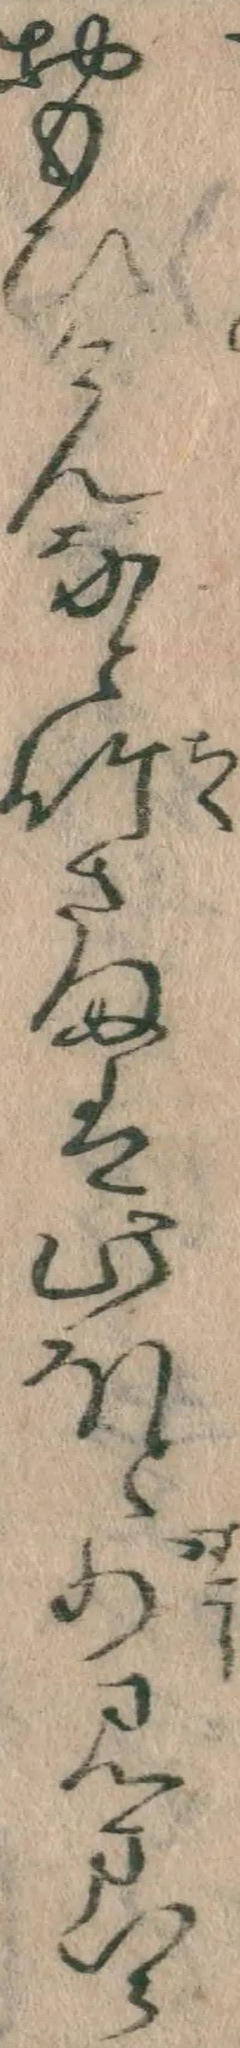おもひけんなと竹さまは此ほと少見まいら
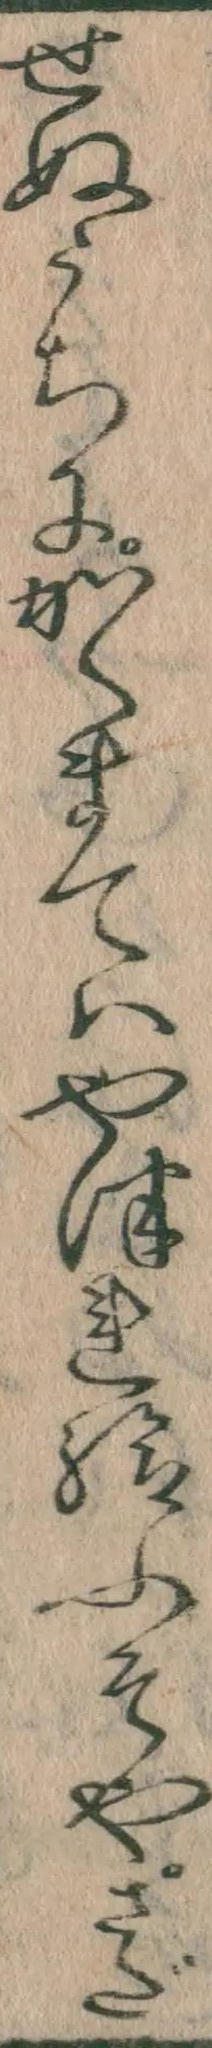せぬうちに。かくまてはやつれ給ふそや。さだ
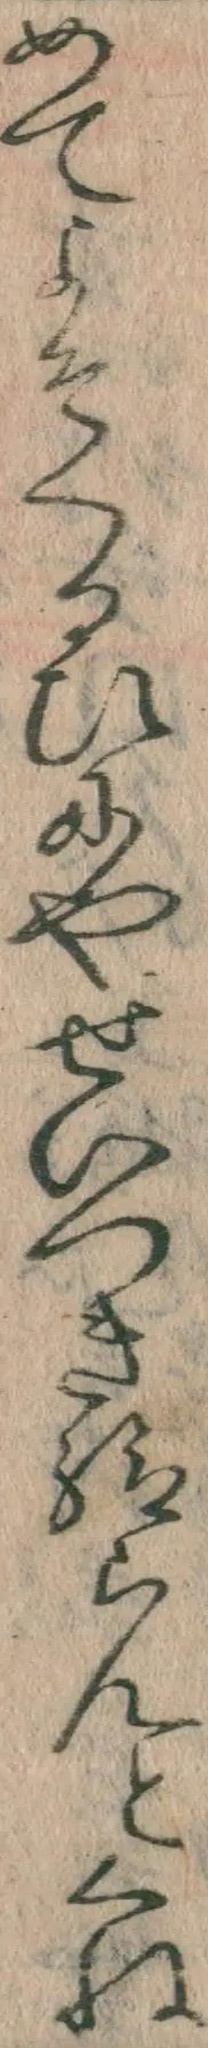めてよそくるひにやせいつき給らんとくね

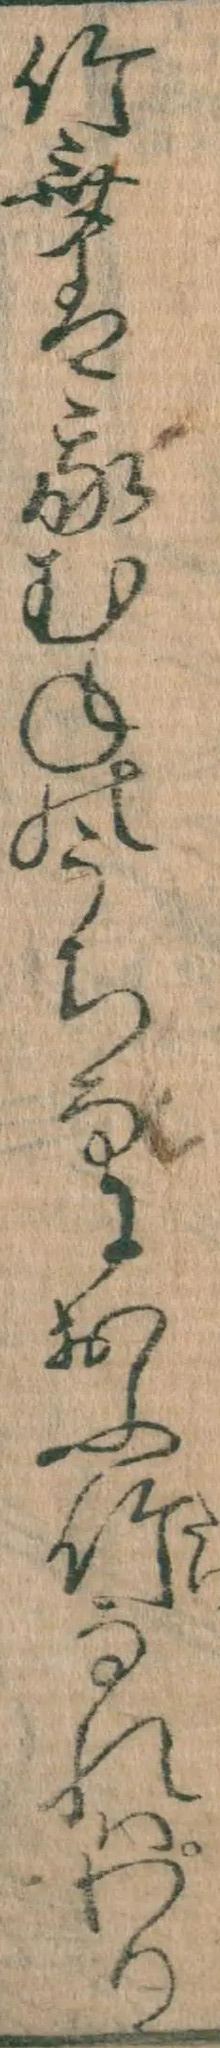竹斎は我むねのうちなにおふ竹なれは。わり
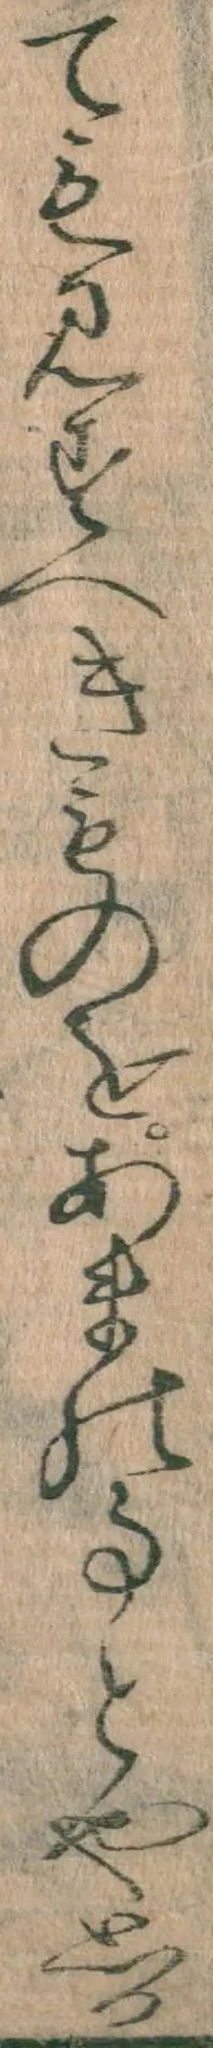ても見すへきものを。あまの事とや思ひ
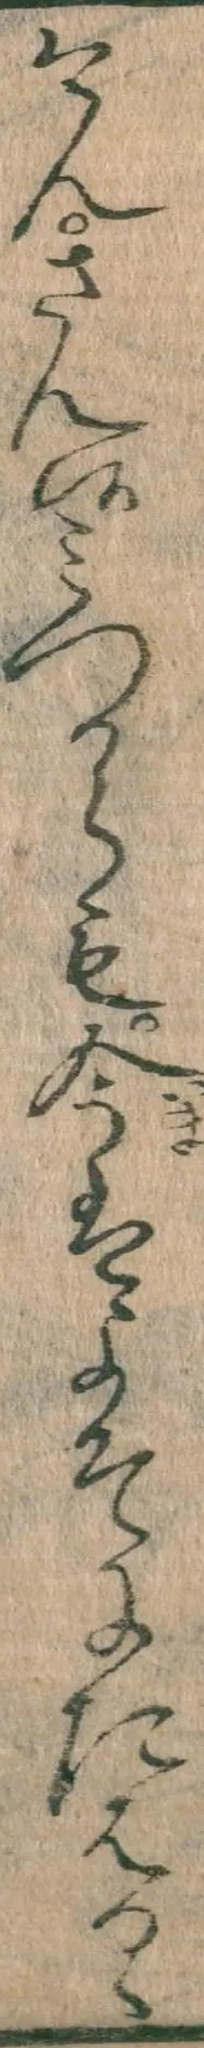けん。さん候みつからも。今はよそにたはるゝ
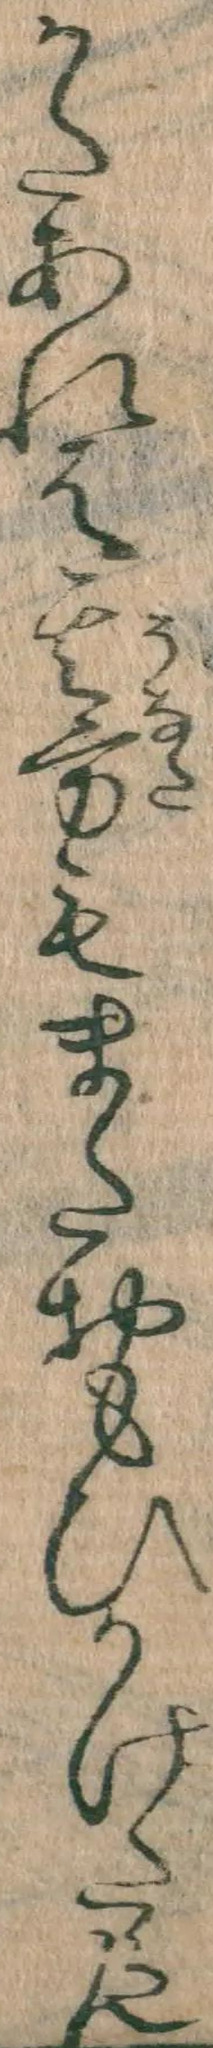かたあれは其方もまたおもひかけたらん
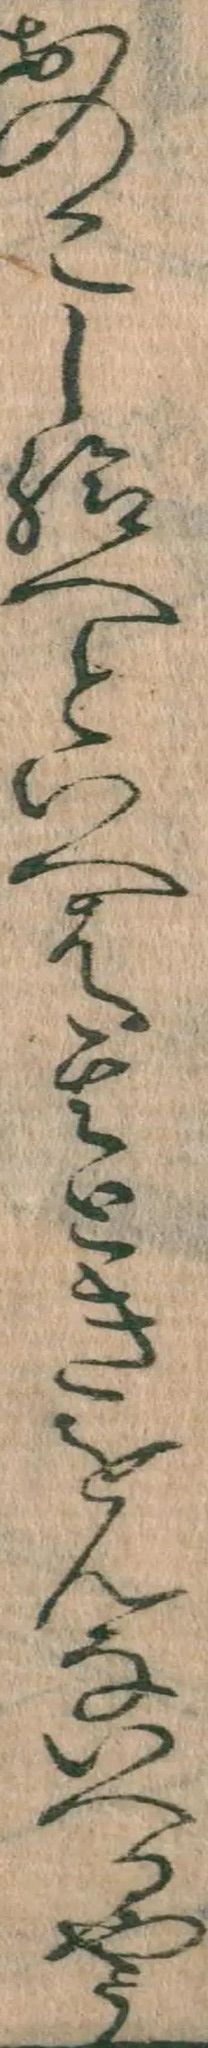おのこし給へといへは其ときをんないへるやう
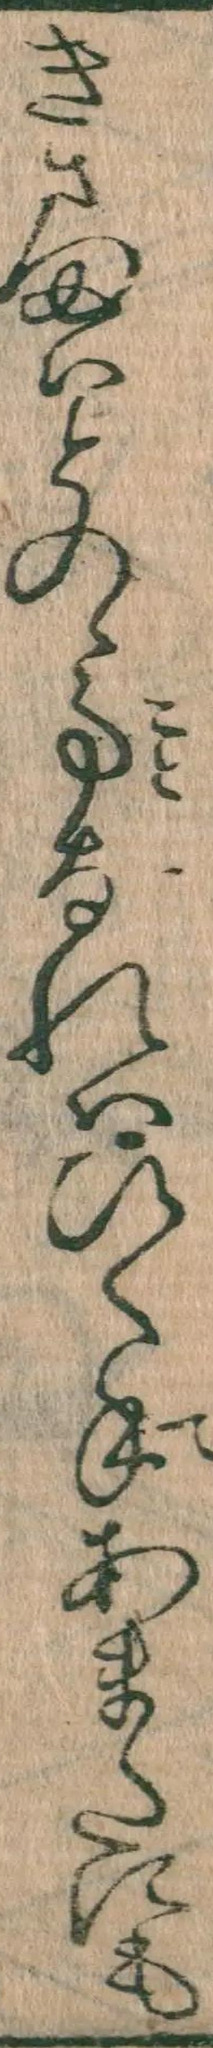きさまはとのゝ事なれは、ひく手あまたにも
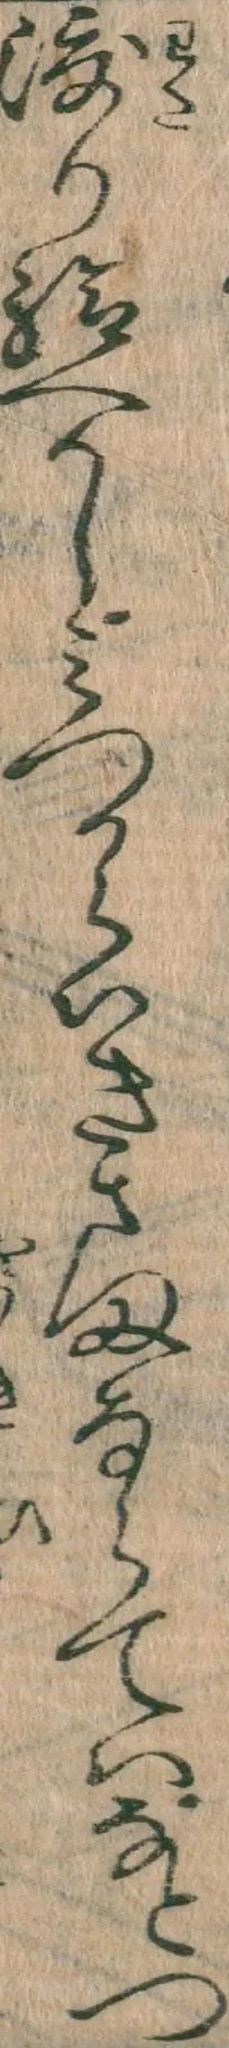渡り給へかし、みつからはきさまならては、なとつ
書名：竹斎狂歌物語 3巻
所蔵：国立国会図書館 National Diet Library, JAPAN
